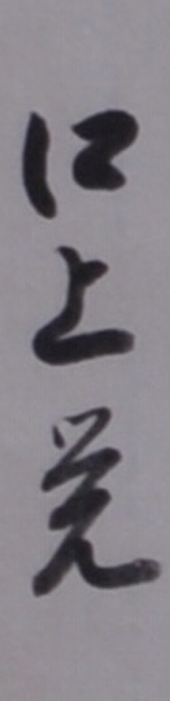口上覚
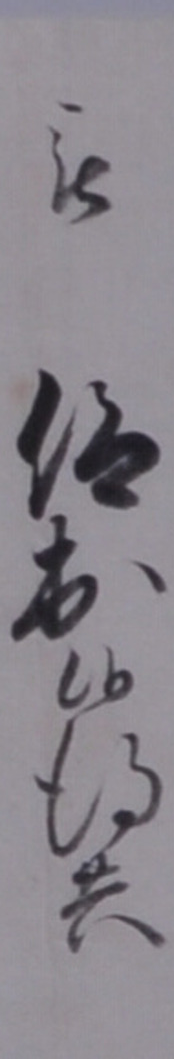被仰出候得共
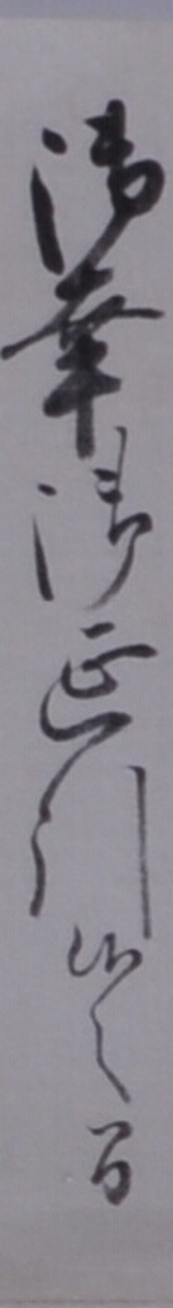御幸御延引候之間
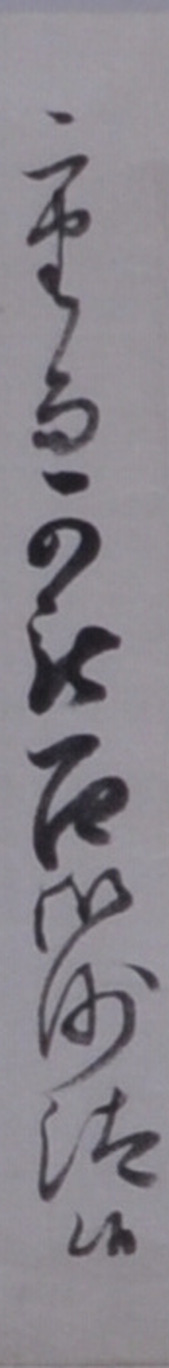重而可被召御沙汰候
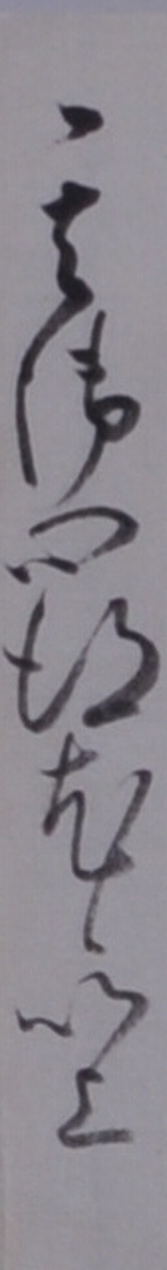其御心得尤候以上
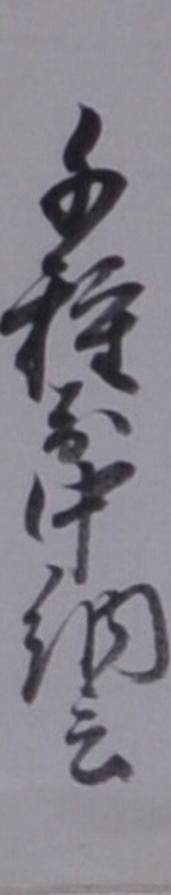千種前中納言
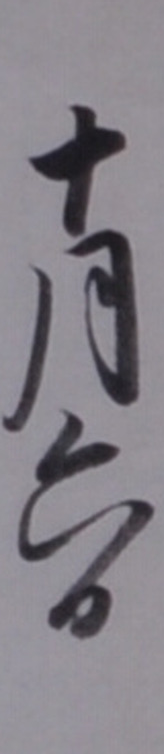十月六日
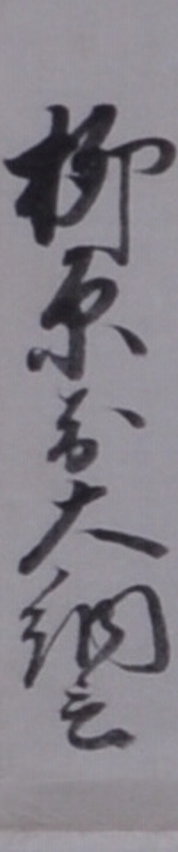柳原前大納言
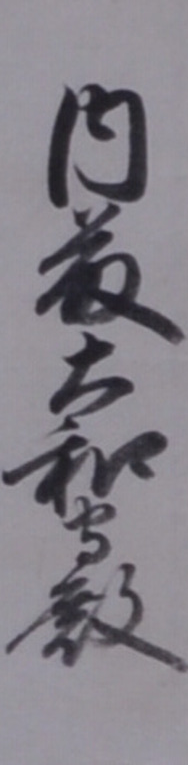内藤大和守殿
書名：口上覚
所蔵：伊那市立高遠町図書館・合同会社AMANE
